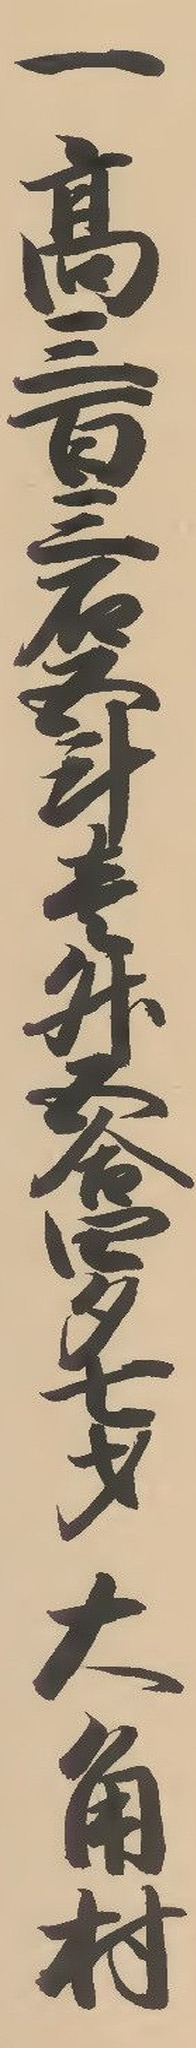一高三百三石五斗壱升五合四勺七才大角村
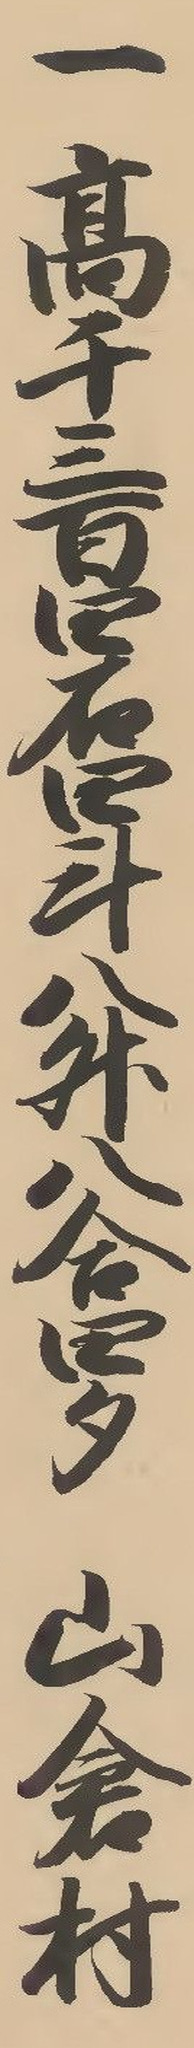一高千三百四石四斗八升八合四勺山倉村
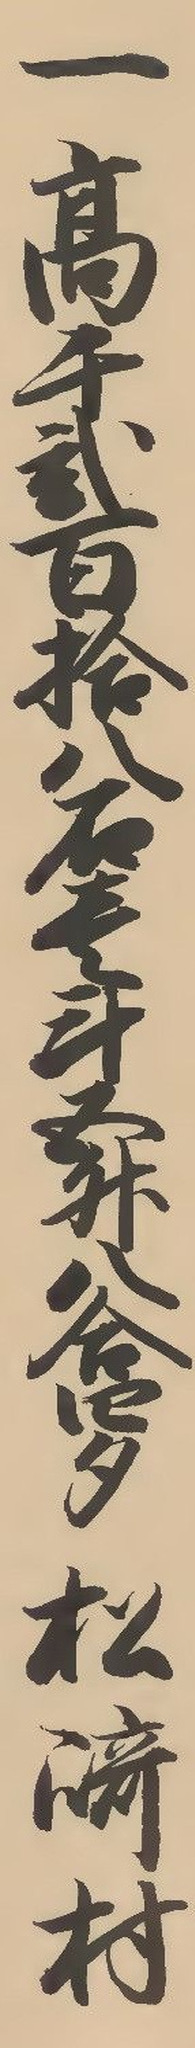一高千弐百拾八石壱斗五升八合四勺松崎村
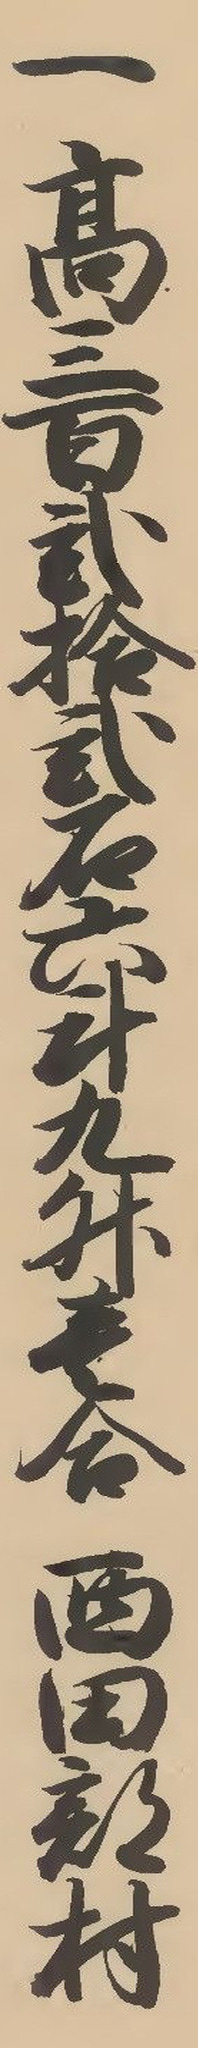一高三百弐拾弐石六斗九升壱合西田部村
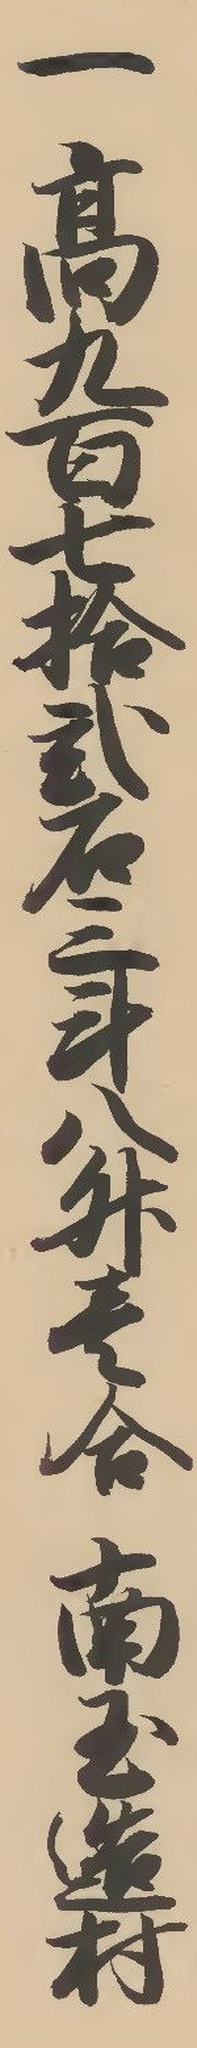一高九百七拾弐石三斗八升壱合南玉造村

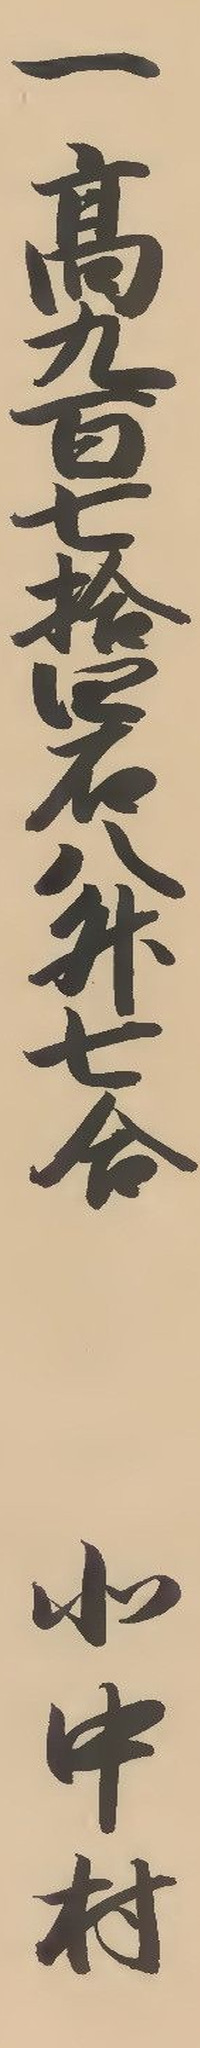一高九百七拾四石八升七合北中村
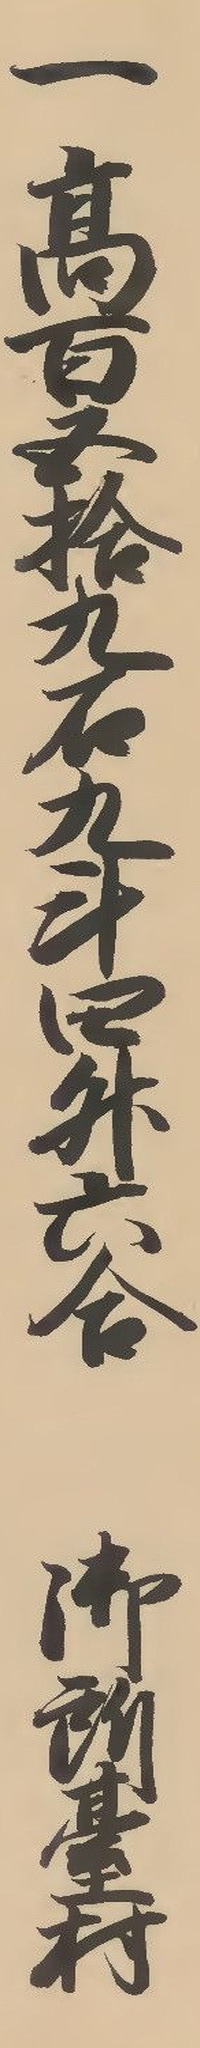一高百五拾九石九斗四升六合御所台村
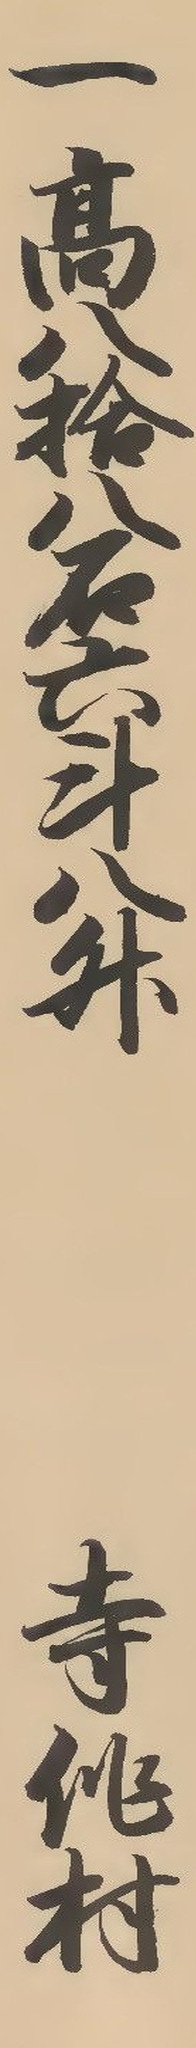一高八拾八石六斗八升寺作村
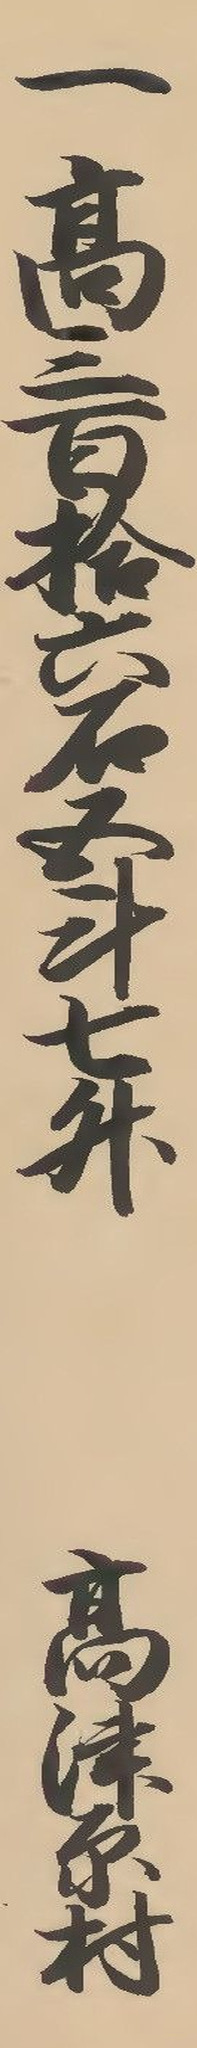一高三百拾六石五斗七升高津原村
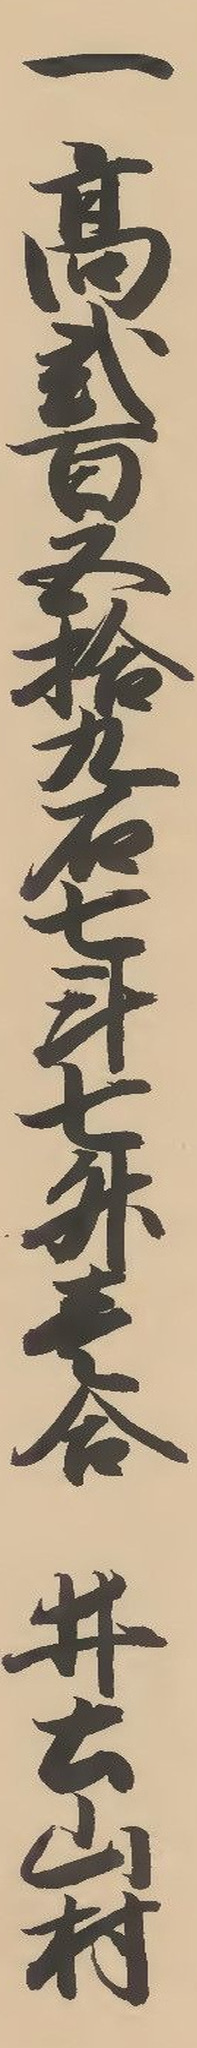一高弐百五拾九石七斗七升壱合井土山村
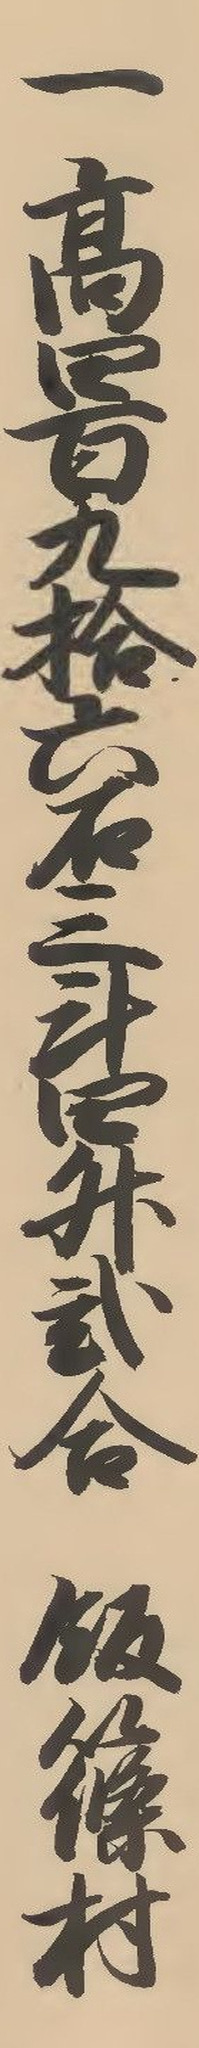一高四百九拾六石三斗四升弐合飯篠村
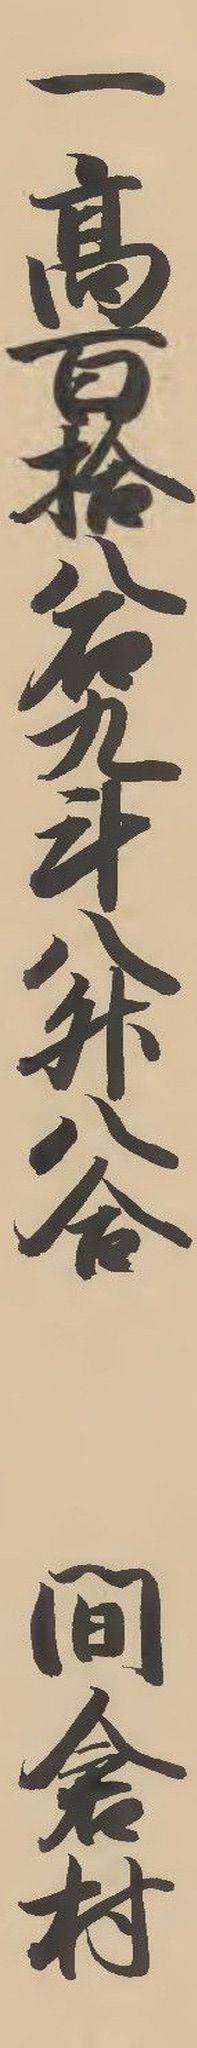一高百拾八石九斗八升八合間倉村
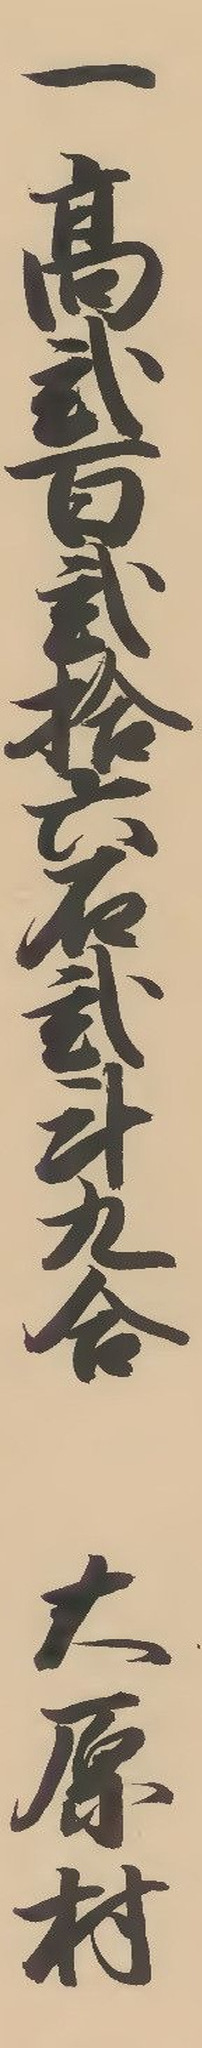一高弐百弐拾六石弐斗九合大原村

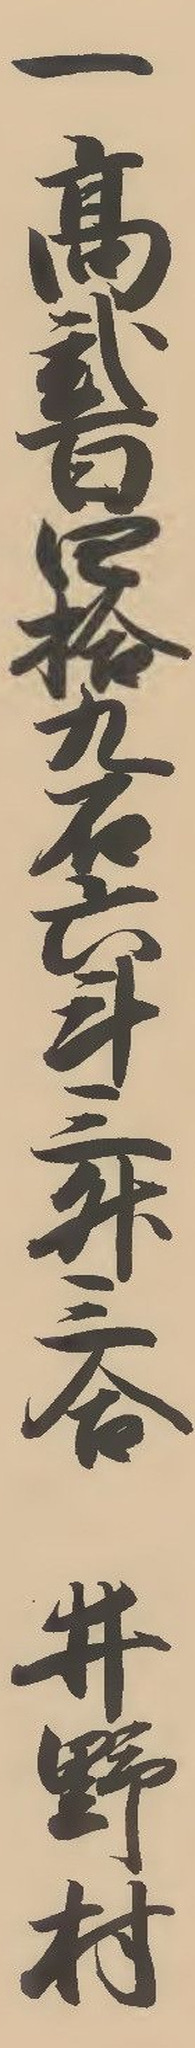一高弐百四拾九石六斗三升三合井野村
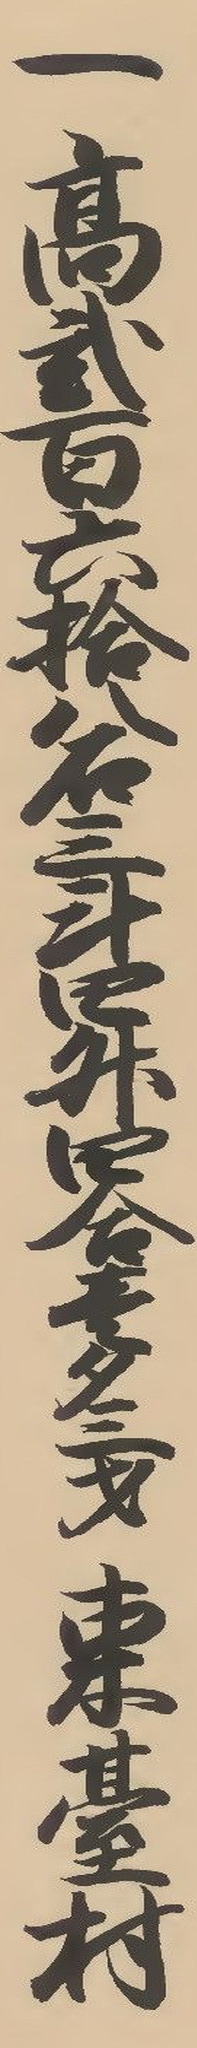一高弐百六拾八石三斗四升四合壱勺三才東台村
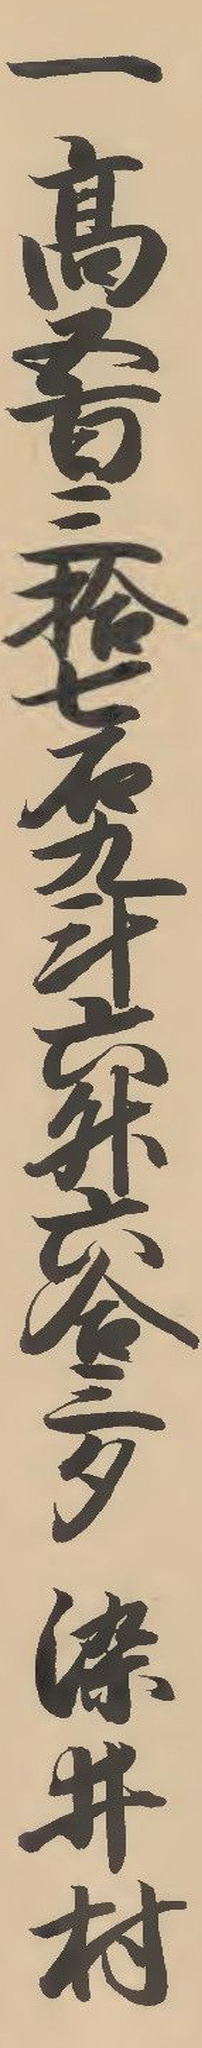一高五百三拾七石九斗六升六合三勺染井村
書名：下総国郷帳
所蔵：国立公文書館 National Archives of Japan
